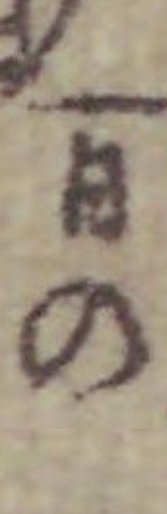一日の
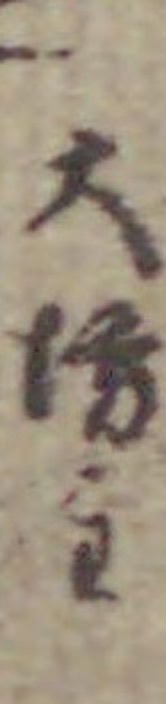大坊主
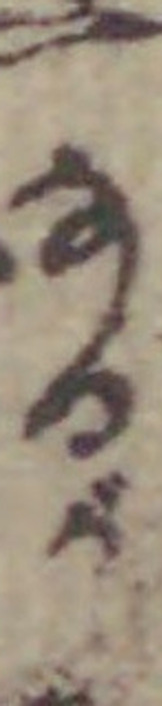なるが
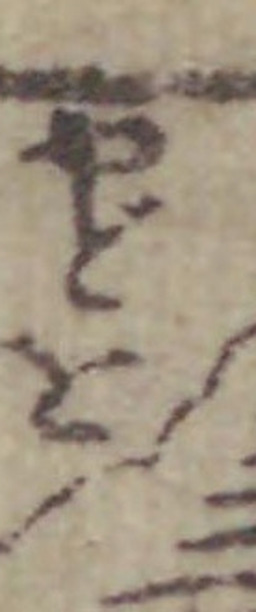やどを
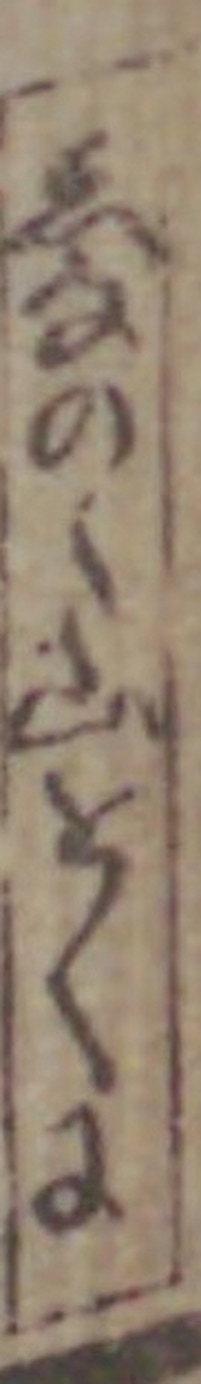しなのゝ山をくに
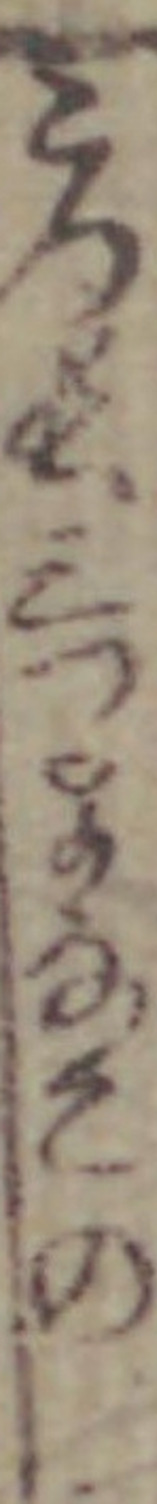こつ長三つまなこの
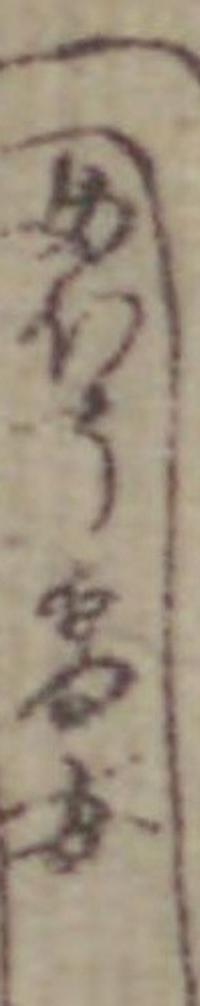女ほう雪女
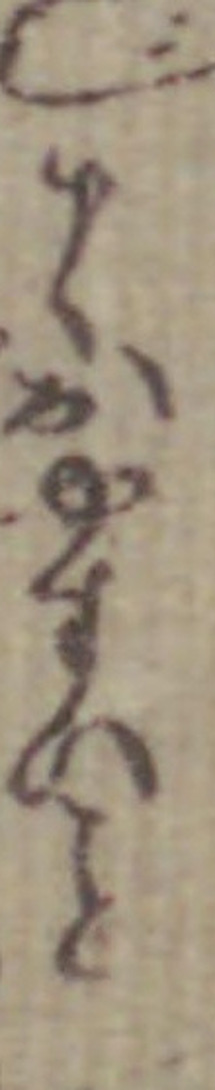アヽおやすいこと
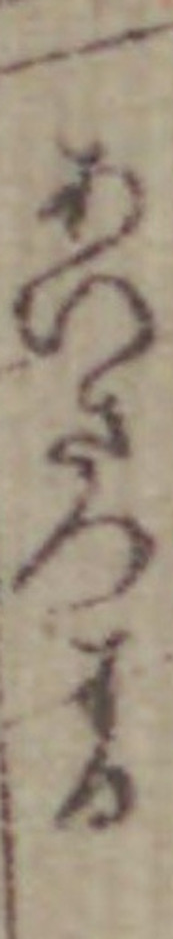あいさつする
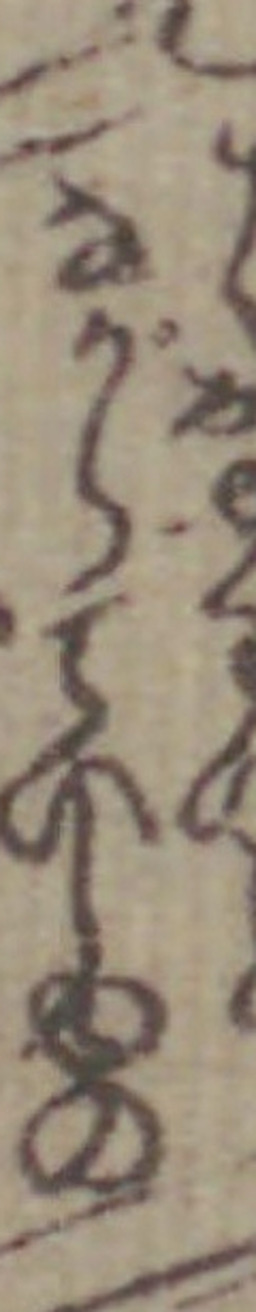ながらていしゆの
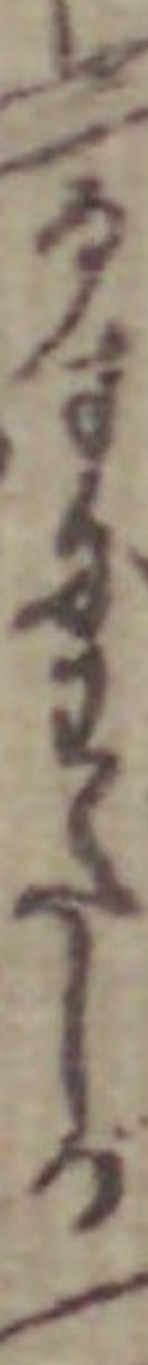るすにわたしが
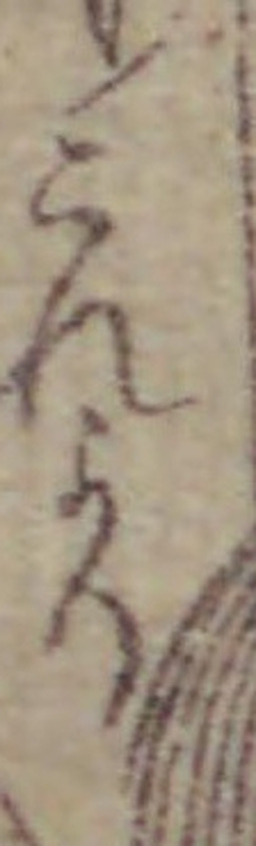これより
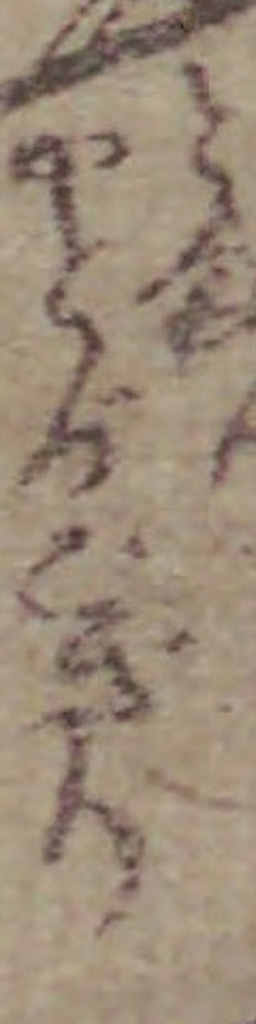やとがござり
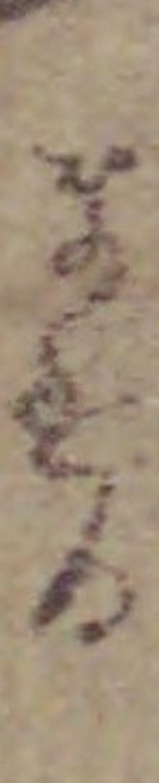まする

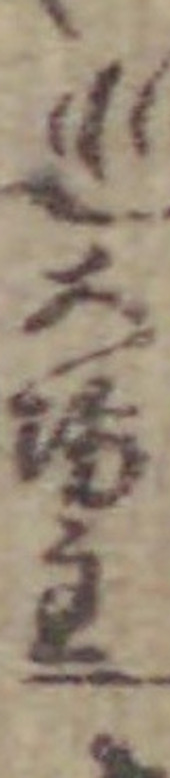大坊主
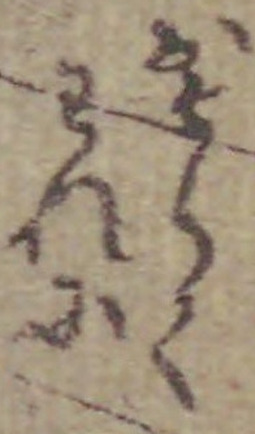われに
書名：妖怪雪濃段 2巻
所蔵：国立国会図書館 National Diet Library, JAPAN
